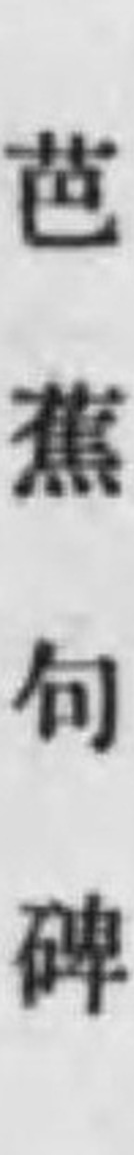芭蕉句碑
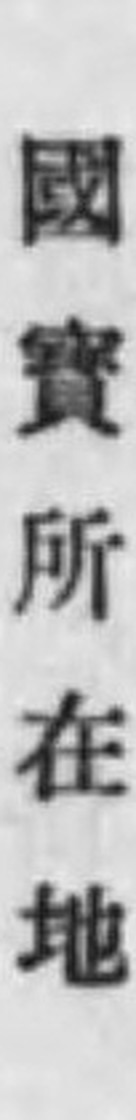国宝所在地
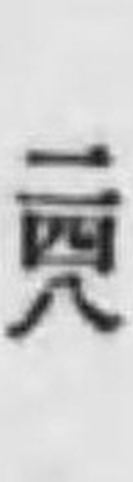二九八
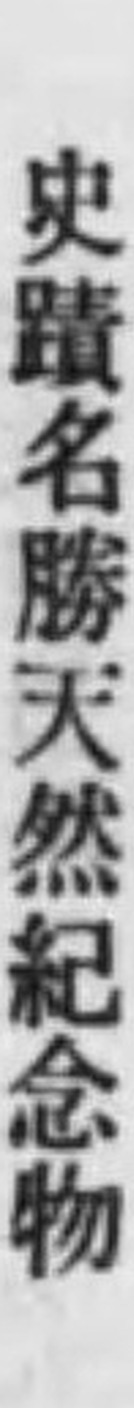史蹟名勝天然紀念物
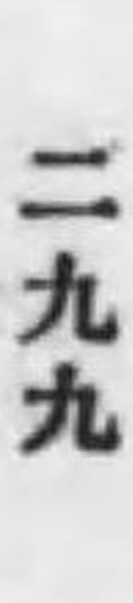二九九

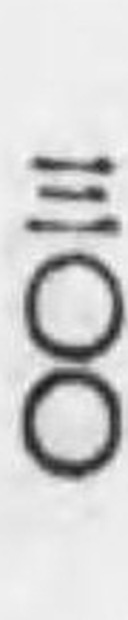三〇〇
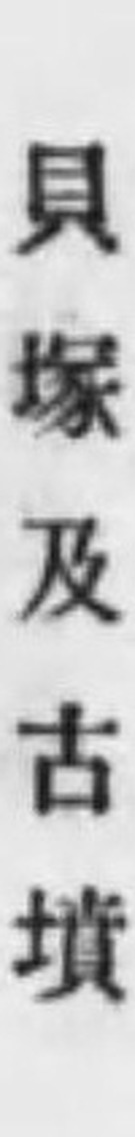貝塚及古墳
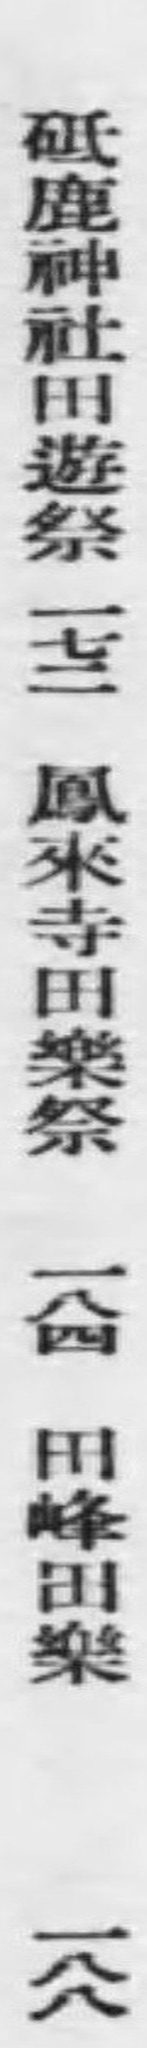砥鹿神社田遊祭一七二鳳来寺田楽祭一八四田峰田楽一八八
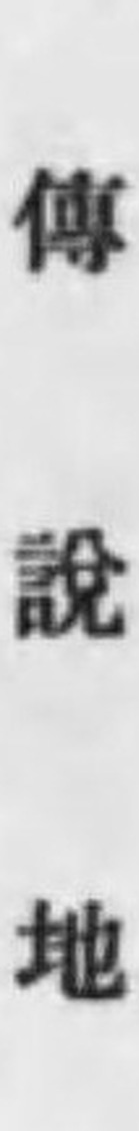伝説地
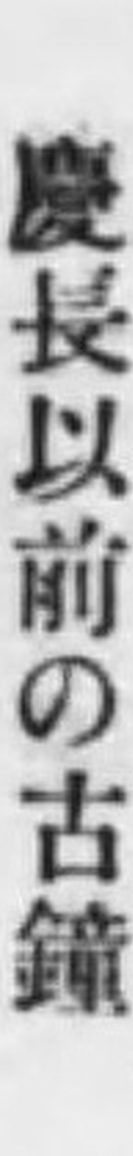慶長以前の古鐘
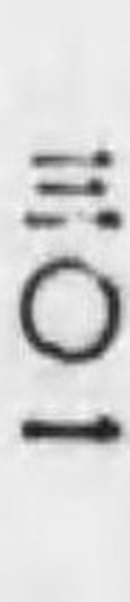三〇一

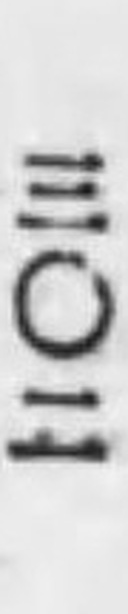三〇二
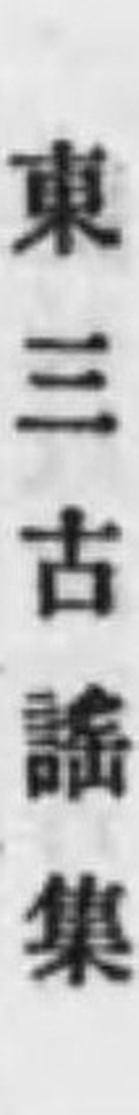東三古謡集
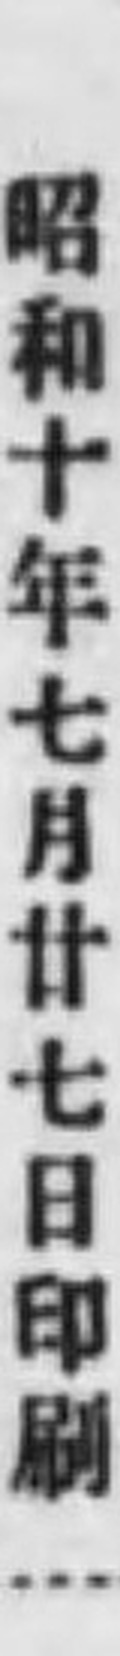昭和十年七月廿七日印刷
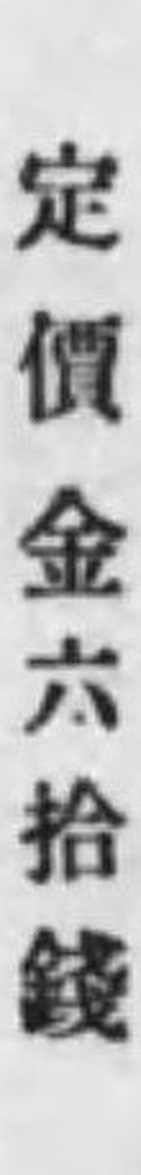定価金六拾銭
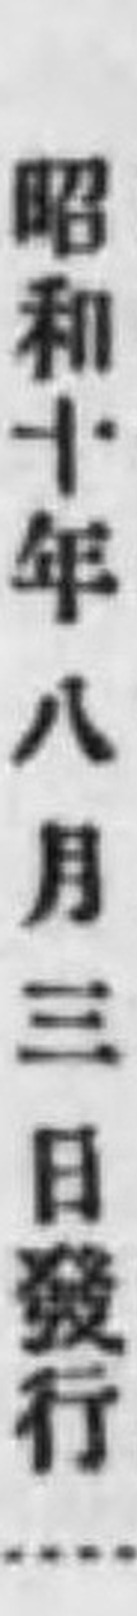昭和十年八月三日発行
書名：東三河道中記 : 豊橋市及其附近案内
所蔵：国立国会図書館 National Diet Library, JAPAN
